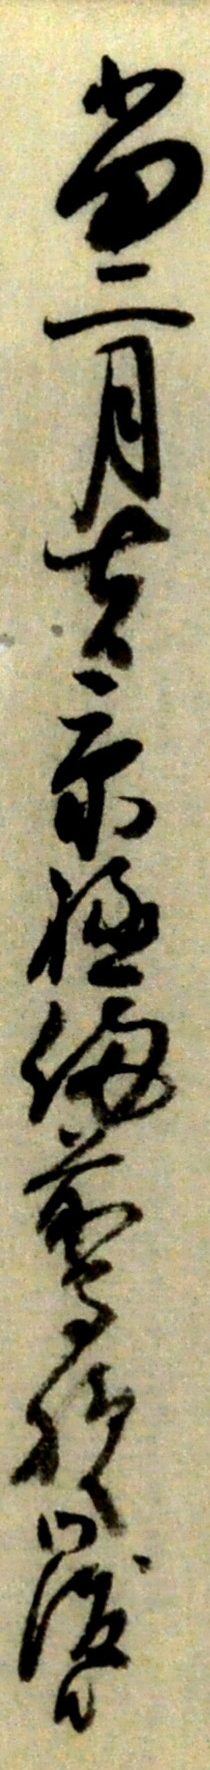当二月七日京極備前守様へ御渡候
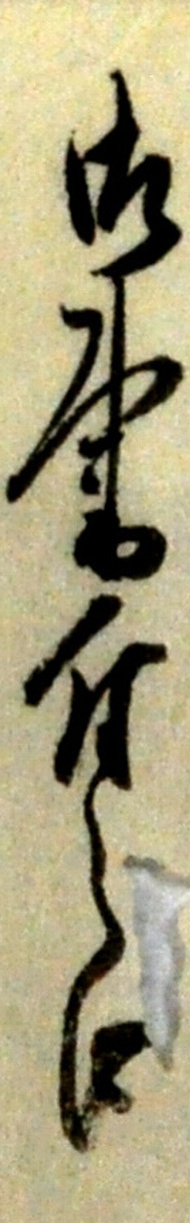御書付之由
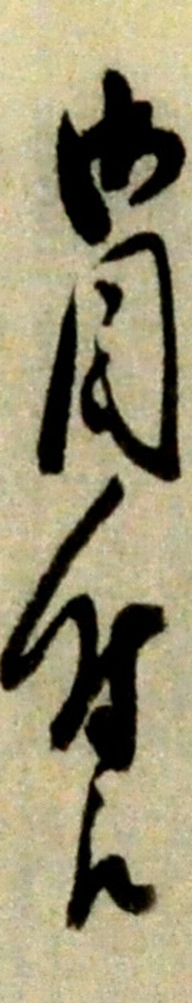御目付え
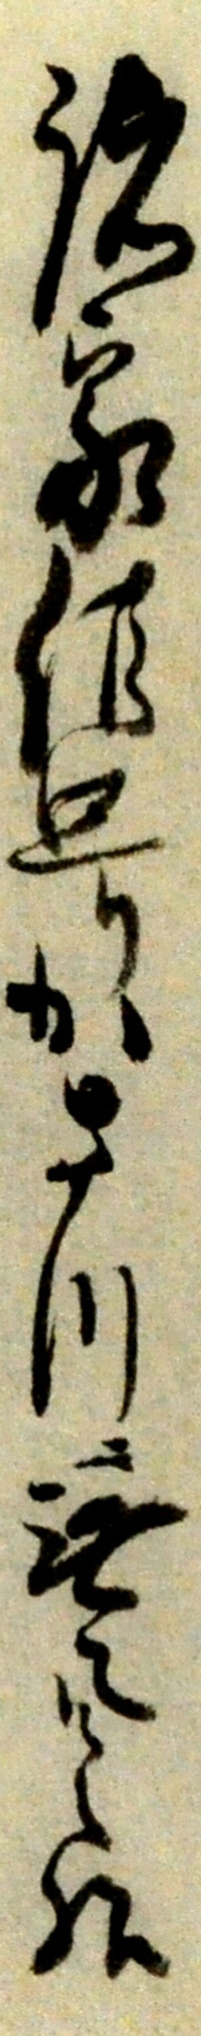諸家供廻りかさつに無之候之様
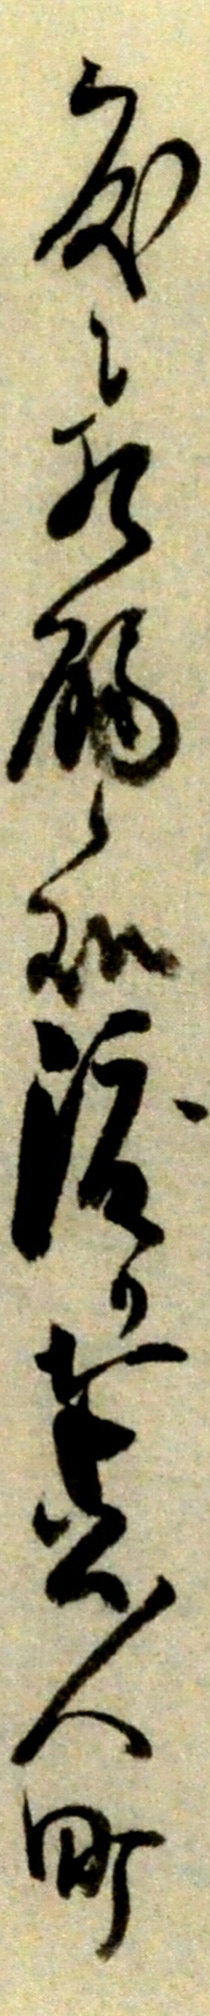度々相触候処渡り奉公人町
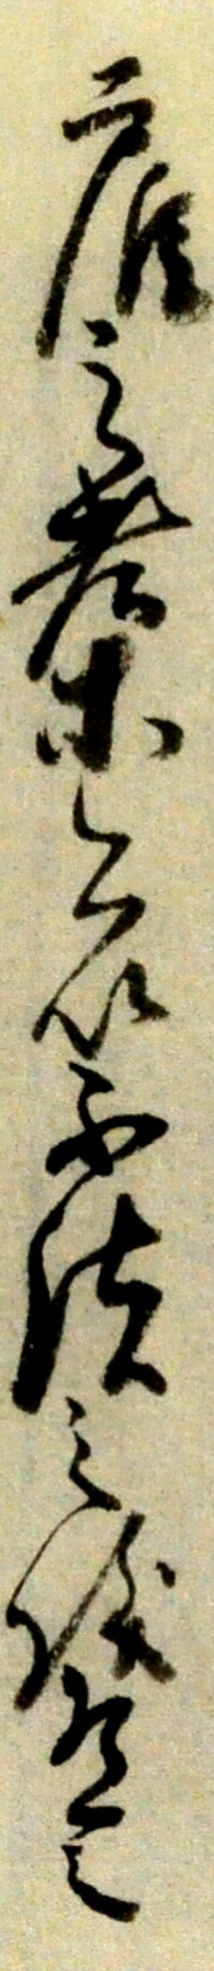雇之者等今以不法之儀有之
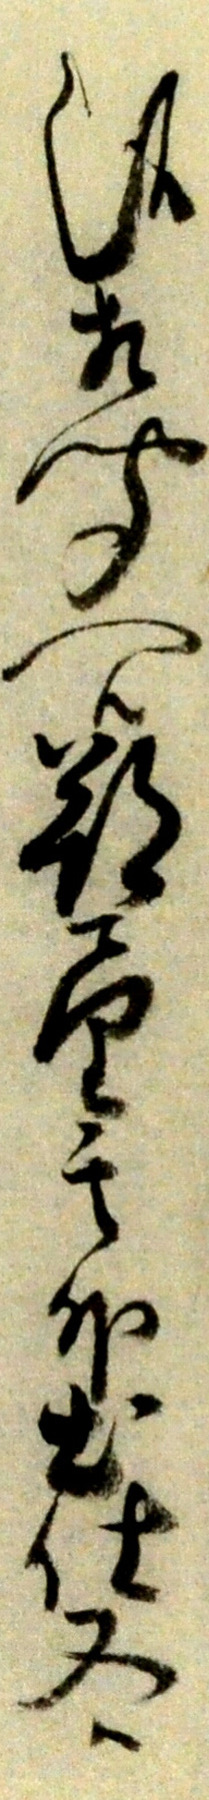趣相聞へ候朔望其外出仕又は
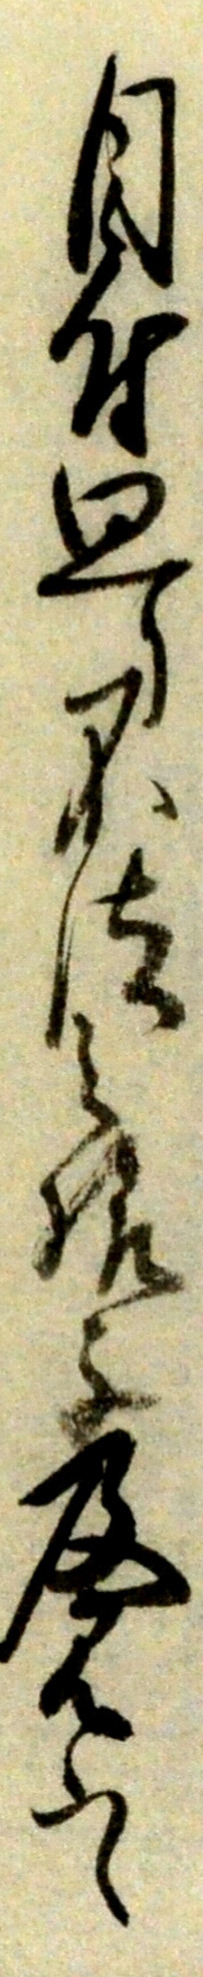目付廻り不法之様子及見候はゝ
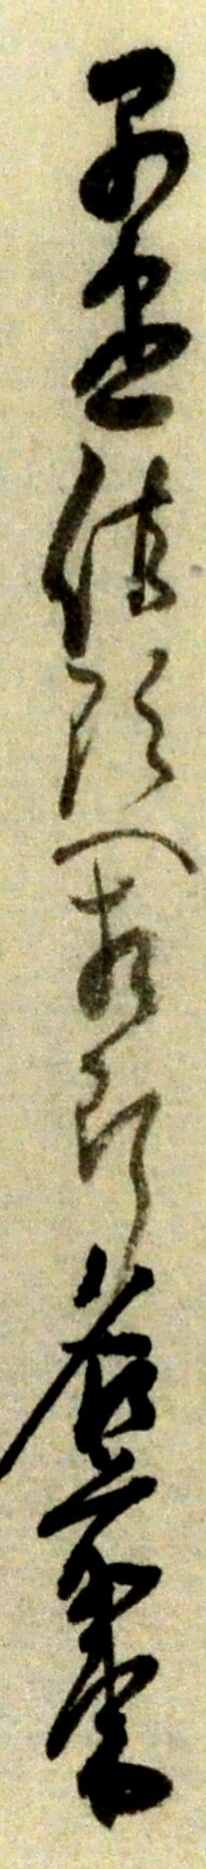早速供頭へ相断名前書
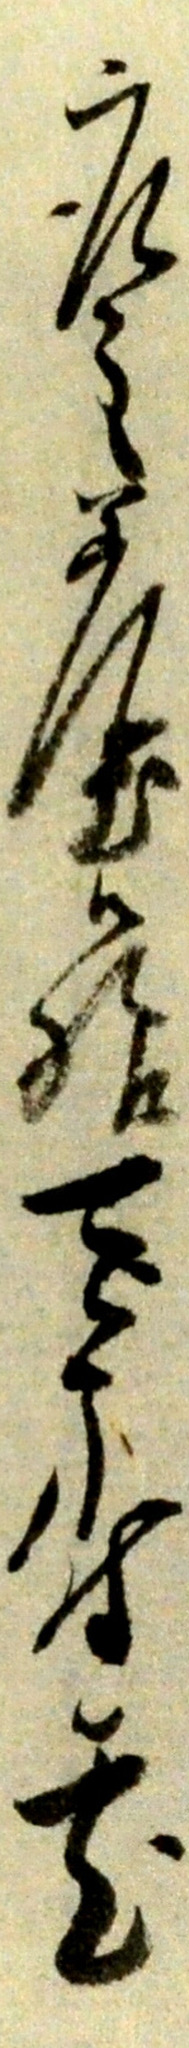取之差出候様可被申付候尤
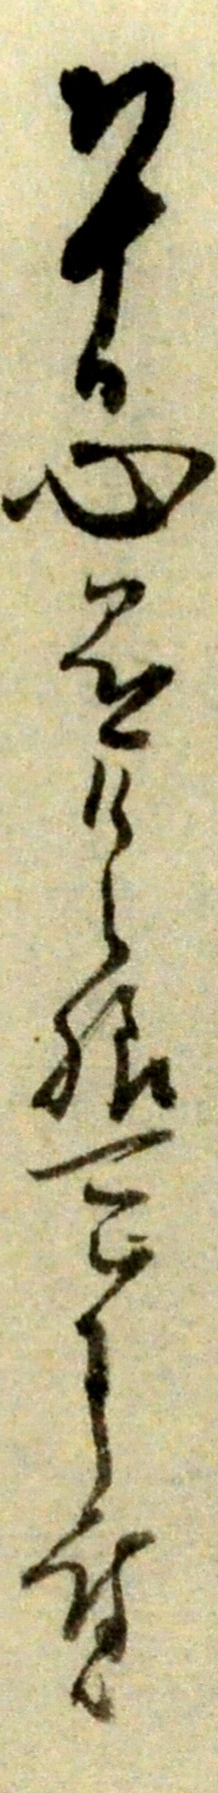平日心懸候之様可被申付候
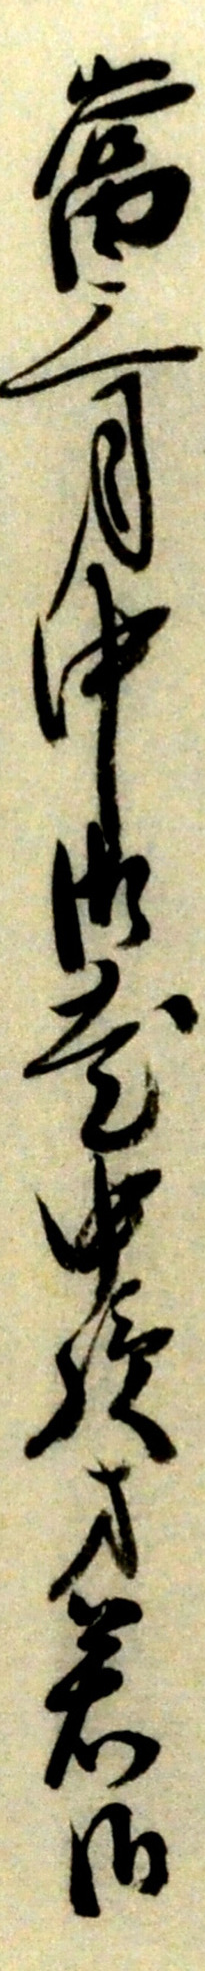当三月中御老中様方若御
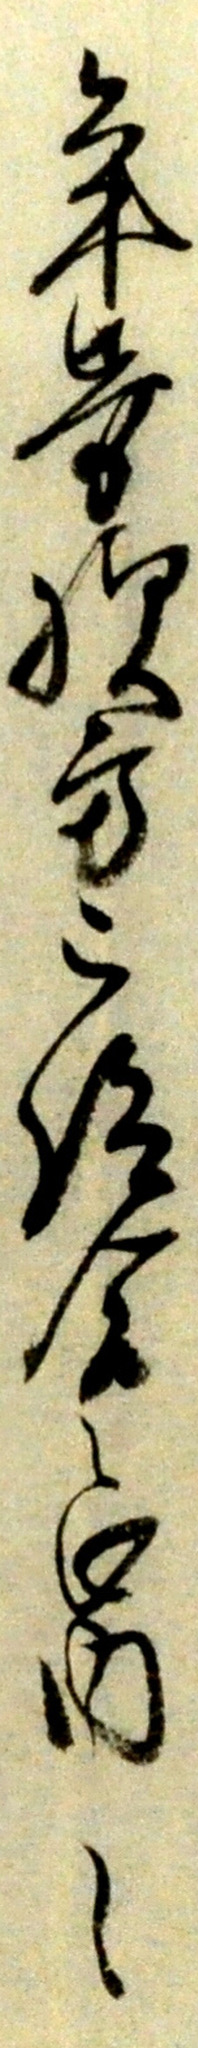年寄様方被仰合之由内々
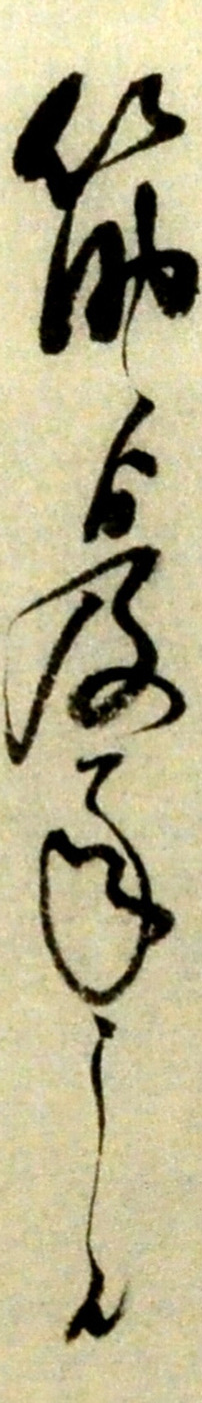筋ゟ及承申候
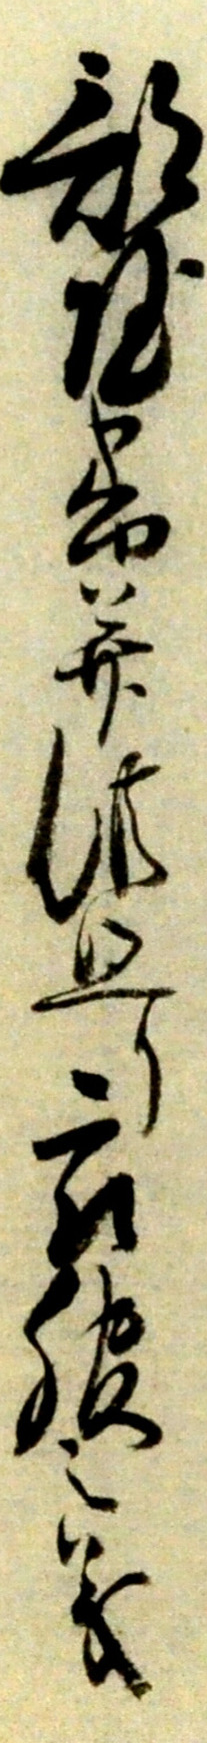部屋番幷供廻り衣服之義
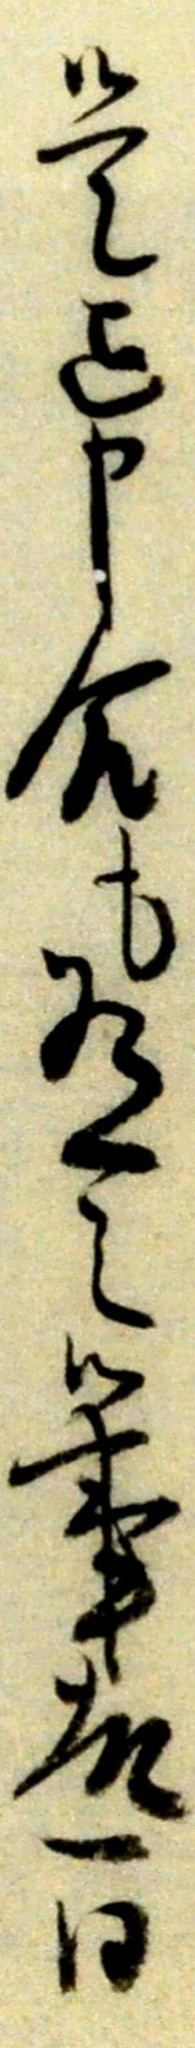是迄申合も有之御事故一同
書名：申合帳〔一括〕
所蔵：伊那市立高遠町図書館・合同会社AMANE
